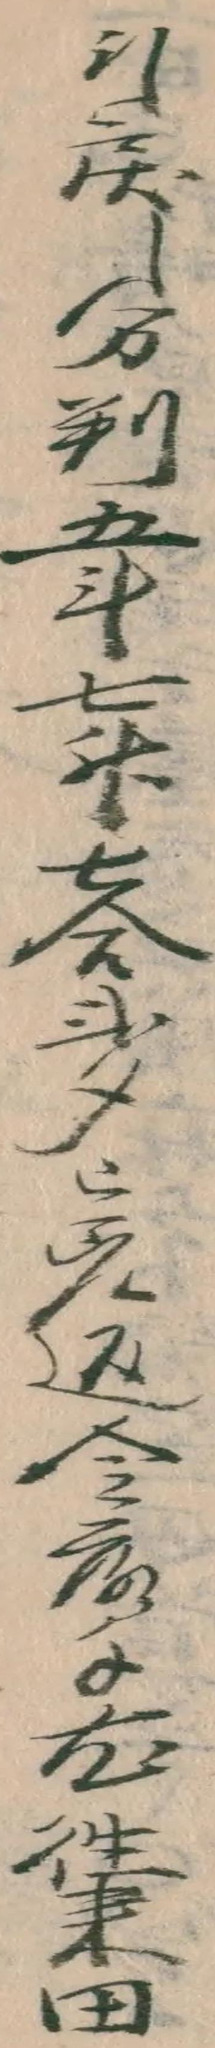引戻し分判五斗七升七合弐夕被差返令落手尤往来田
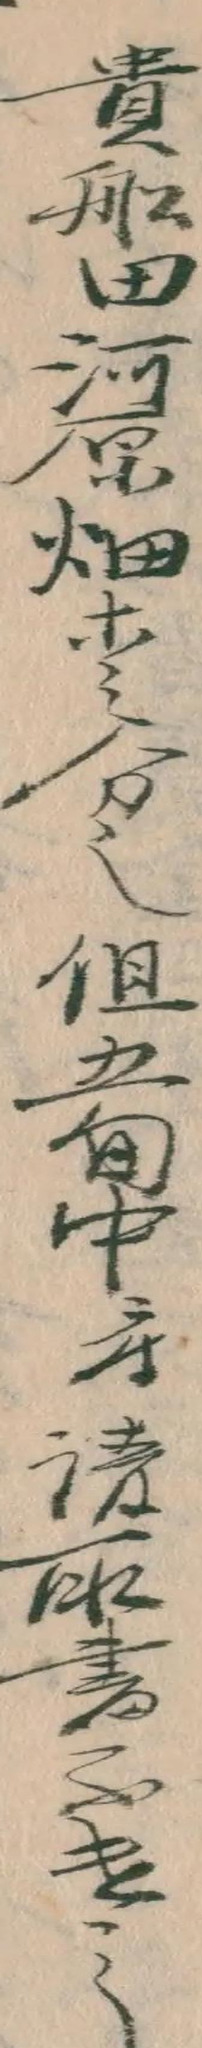貴舩田河原畑等之分也但五旬中ニ付請取書不遣也
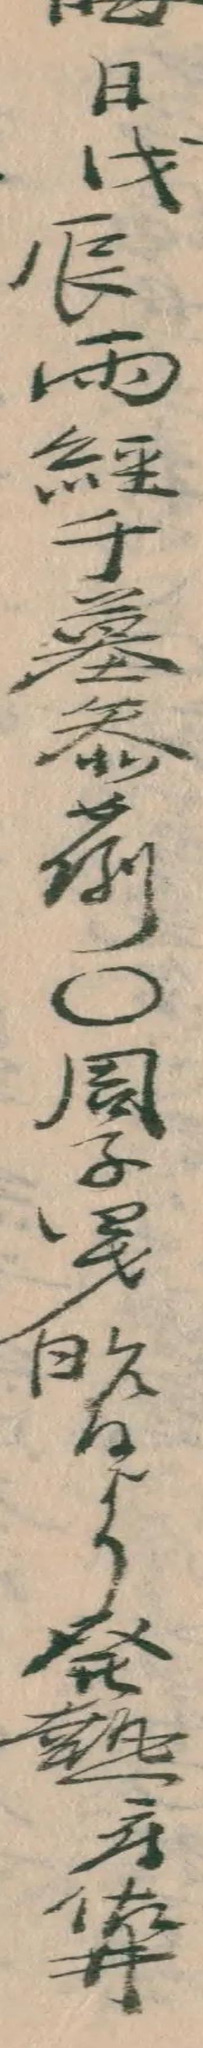晦日戊辰雨経千墓参如例○周子四才昨日ゟより発熱ニ付佐井
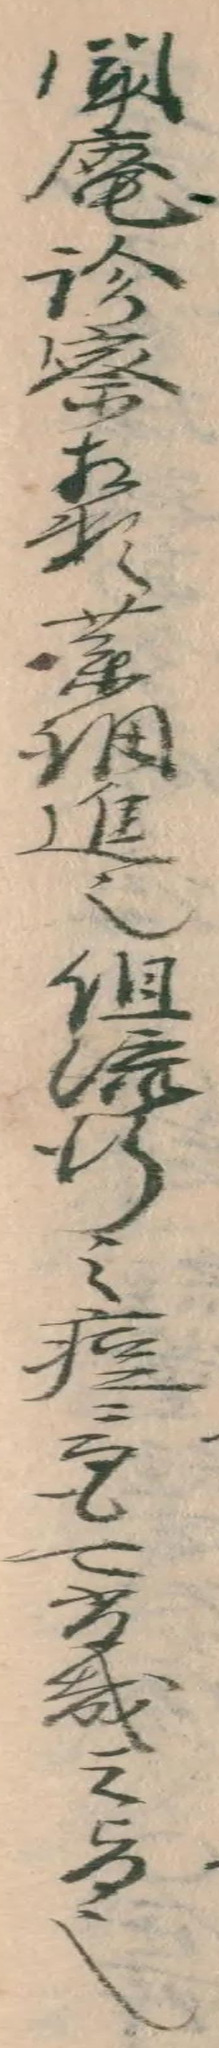聞庵診察相頼薬調進也但流行之痘ニ而も可有哉之旨也
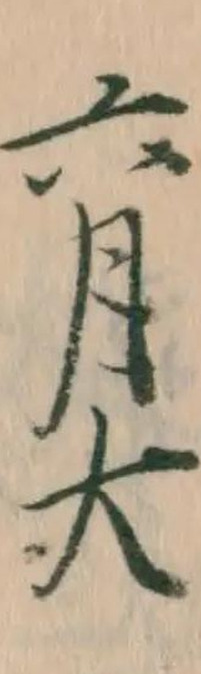六月大
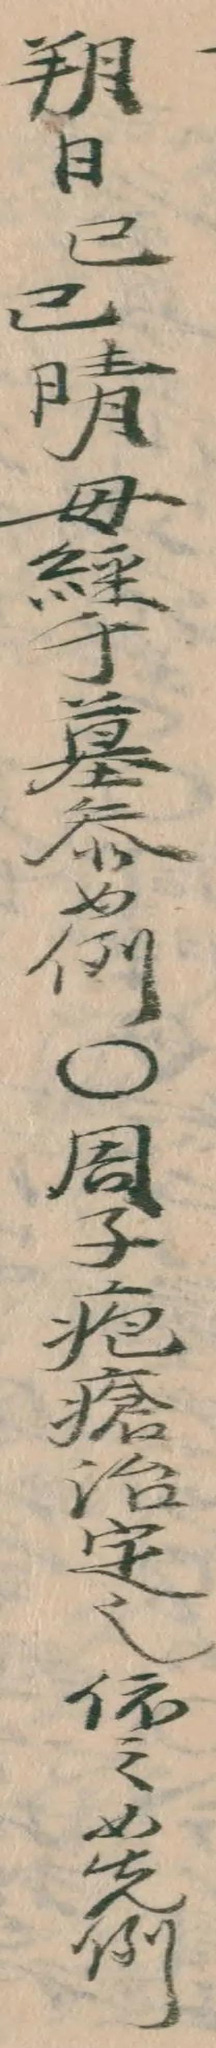朔日己巳晴母経千墓参如例〇周子疱瘡治定也依之如先例
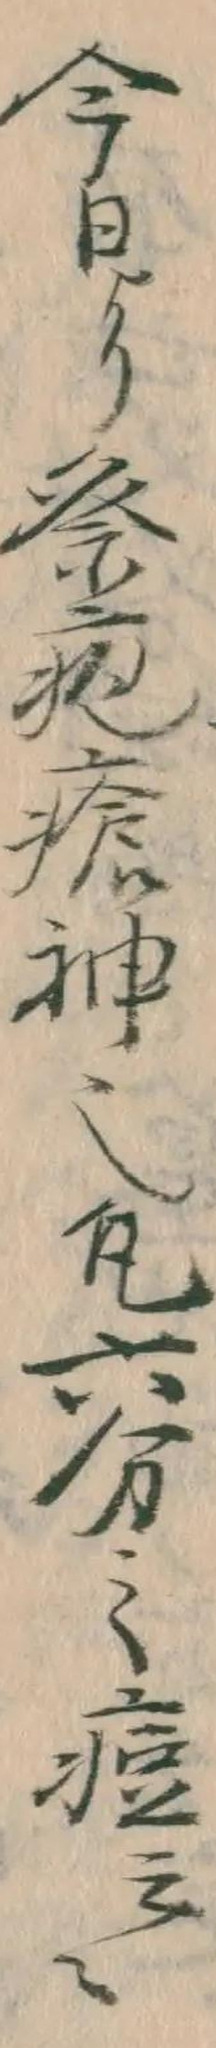今日より祭病瘡神也凡六分之痘云〻
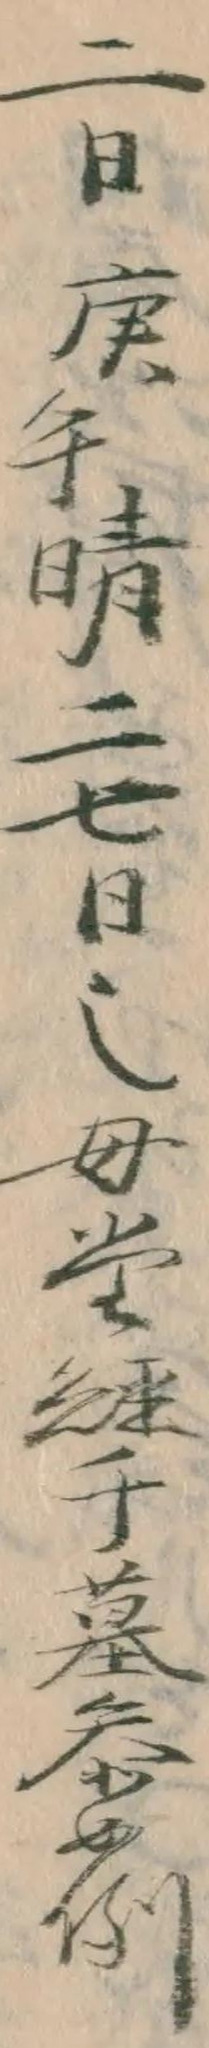二日庚午晴二七日也母堂経千墓参如例
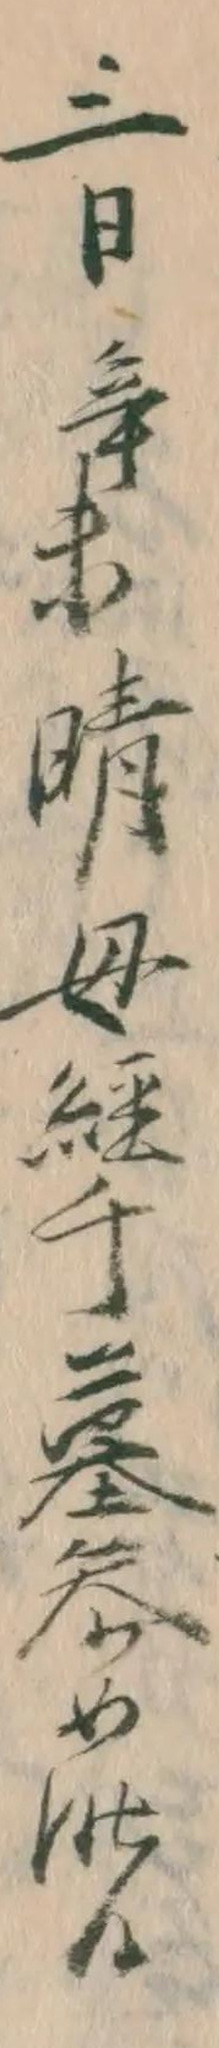三日辛未晴母経千墓参如昨日
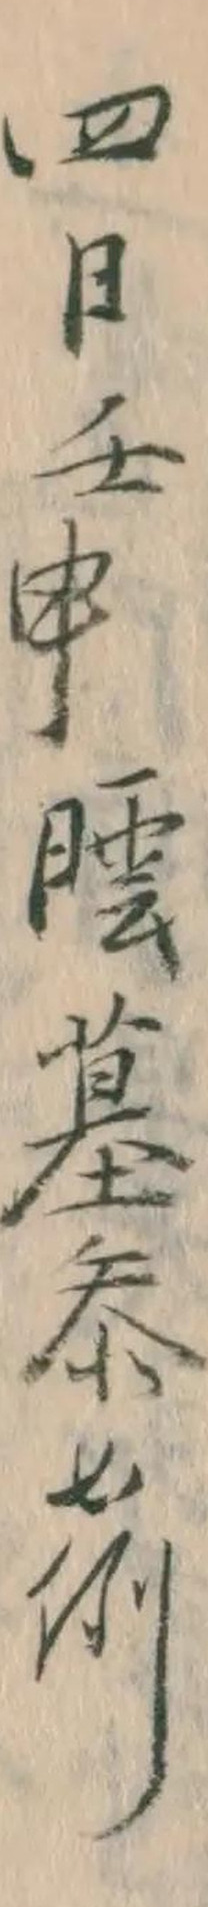四日壬申曇墓参如例
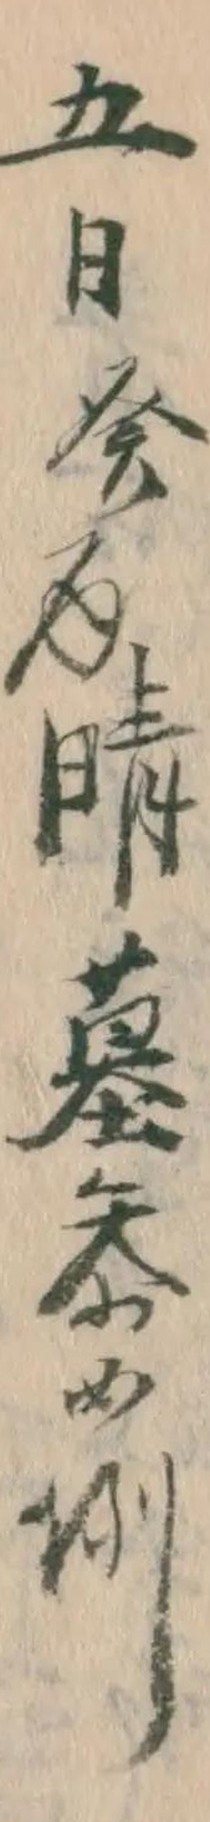五日癸巳晴墓参如例
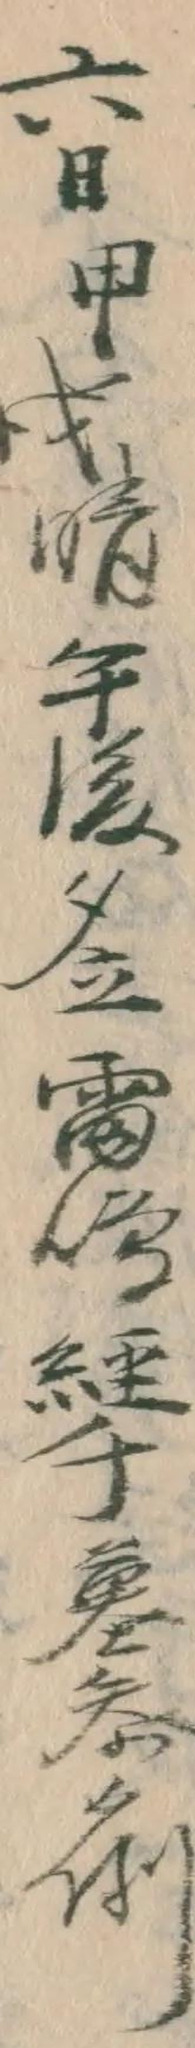六日甲戌晴午後夕立雷鳴経千墓参如例
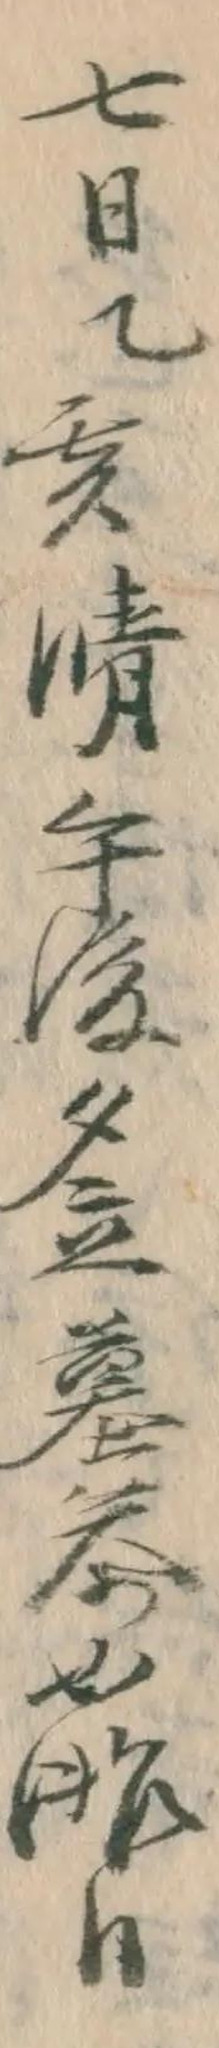七日乙亥晴午後夕立墓参如昨日
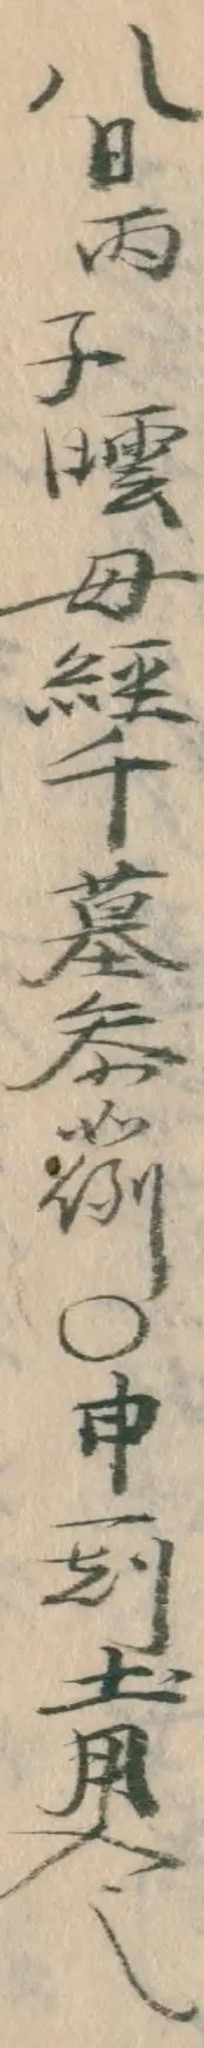八日丙子曇母経千墓参如例〇申一刻土用入也
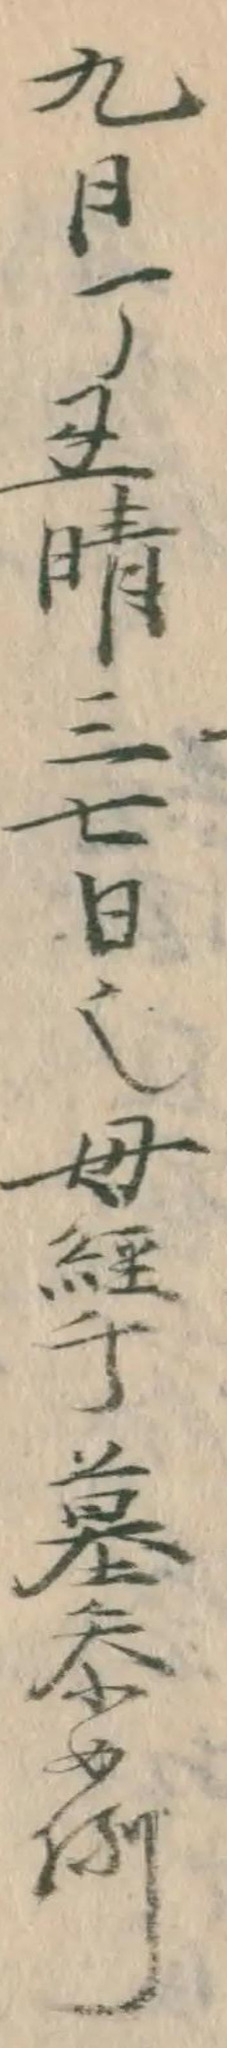九日丁丑晴三七日也母経千墓参如例
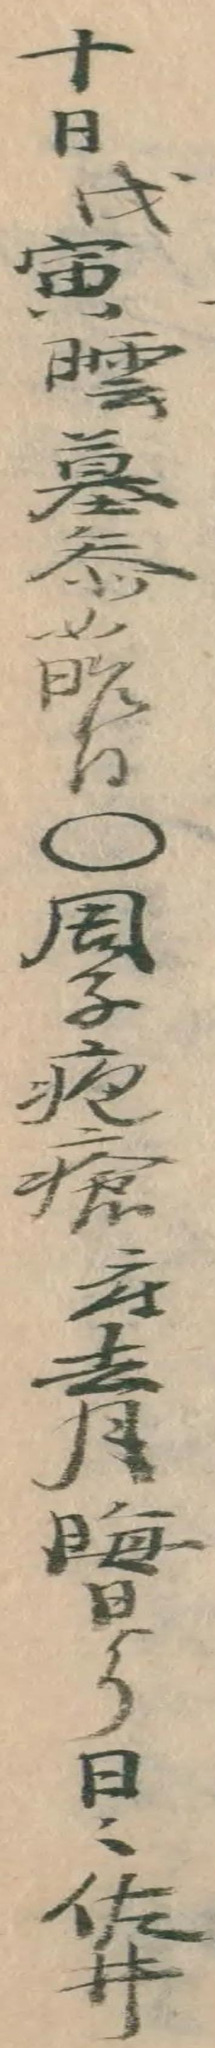十日戊寅曇墓参如昨日〇周子疱瘡ニ付去月晦日より日々佐井
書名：賀茂社記録. 第65冊
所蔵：国立国会図書館 National Diet Library, JAPAN
